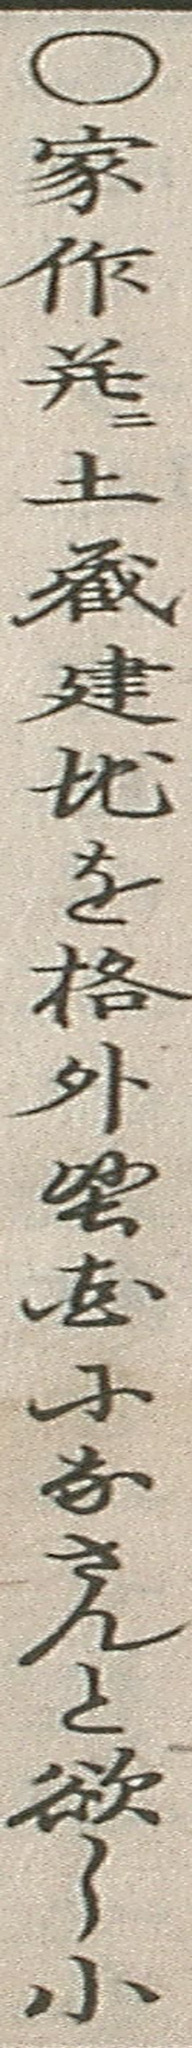〇家作并に土蔵建地を格外堅固になさんと欲し小
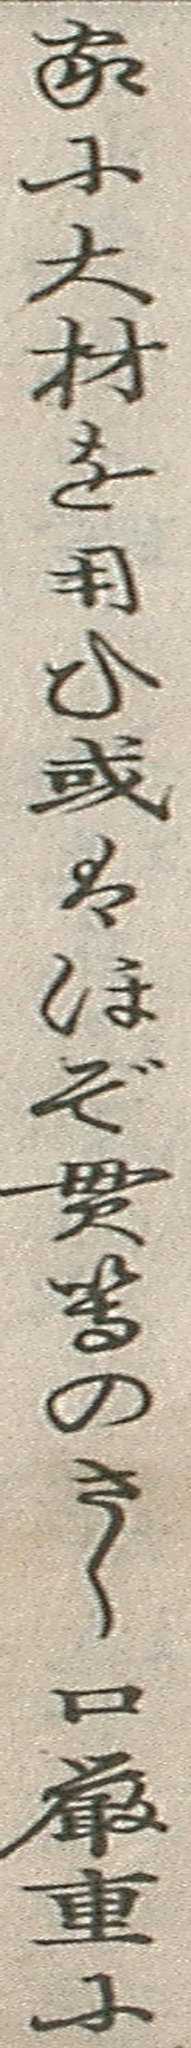家に大材を用ひ或はほぞ貫等のさし口厳重に
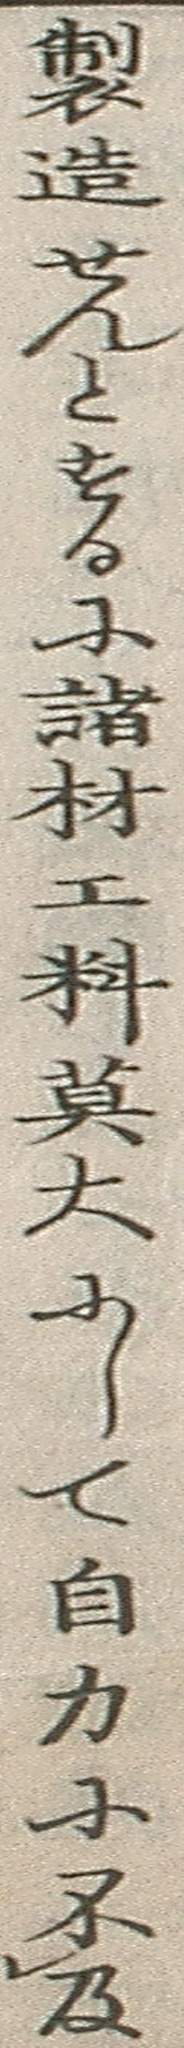製造せんとするに諸材工料莫大にして自力に不及
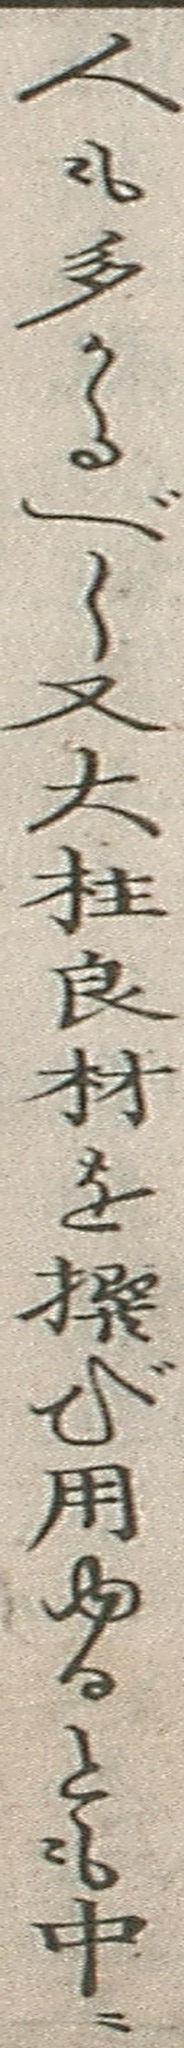人も多かるべし又大柱良材を撰び用ゆるとも中に
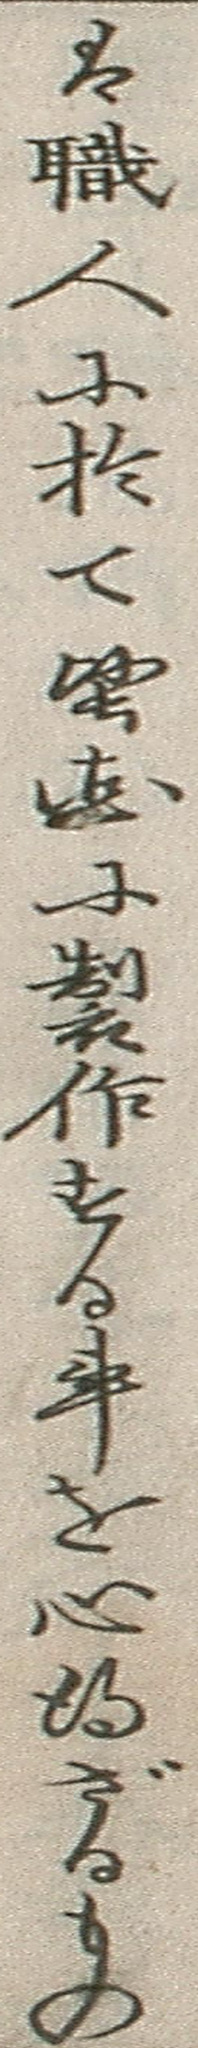は職人に於て堅固に製作する事を心得ざるもの
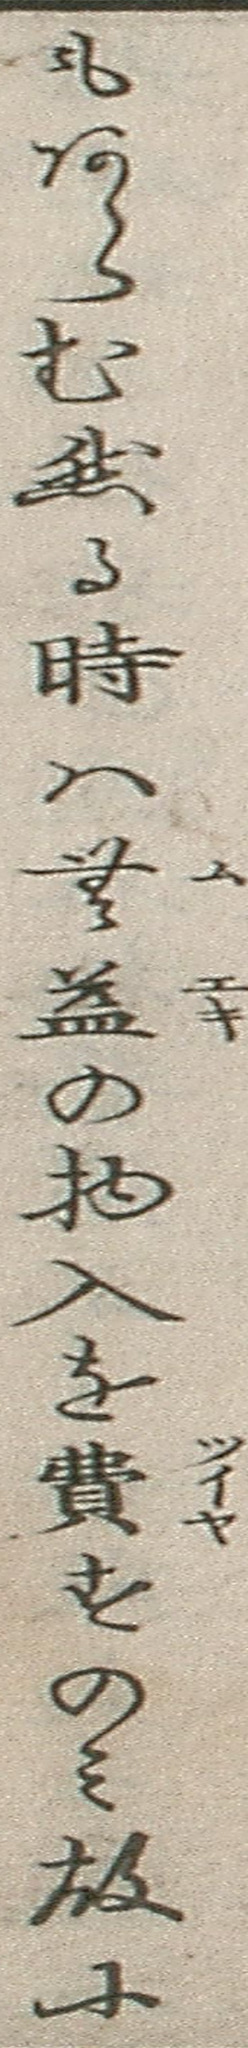もあらむ然る時は無益の物入を費しのみ故に

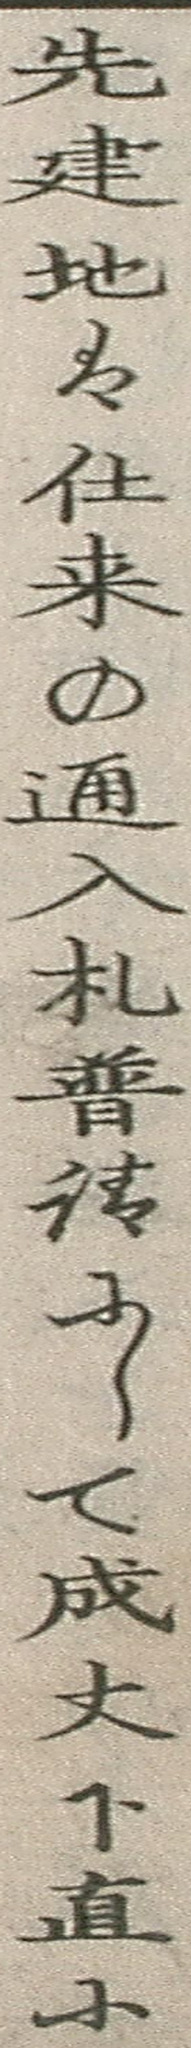先建地は仕来の通入札普請にして成丈下直に
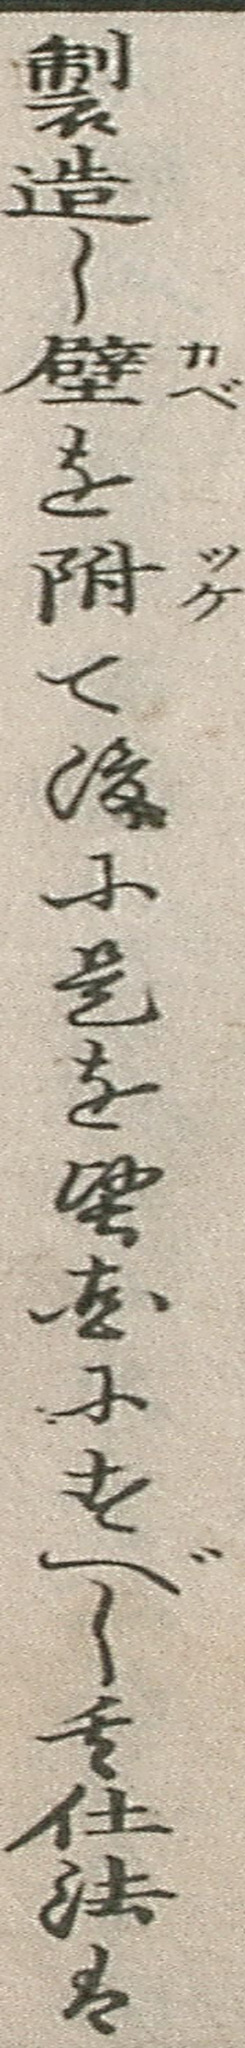製造し壁を附て後に是を堅固にすべし其仕法は
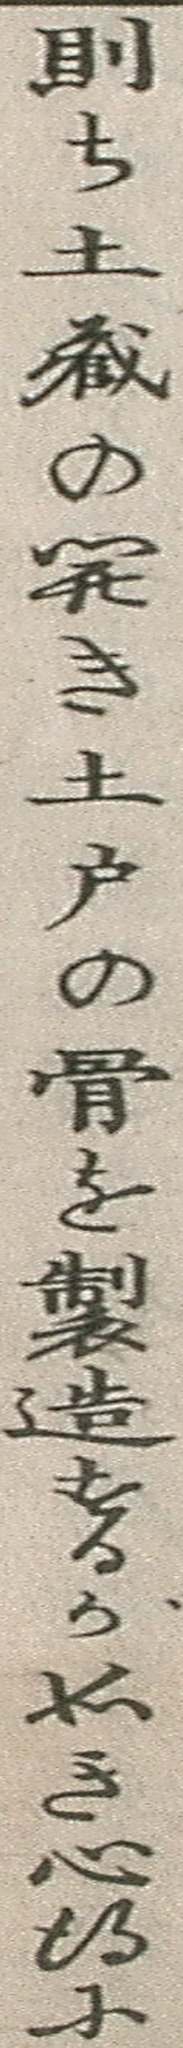則ち土蔵の開き土戸の骨を製造するが如き心得に
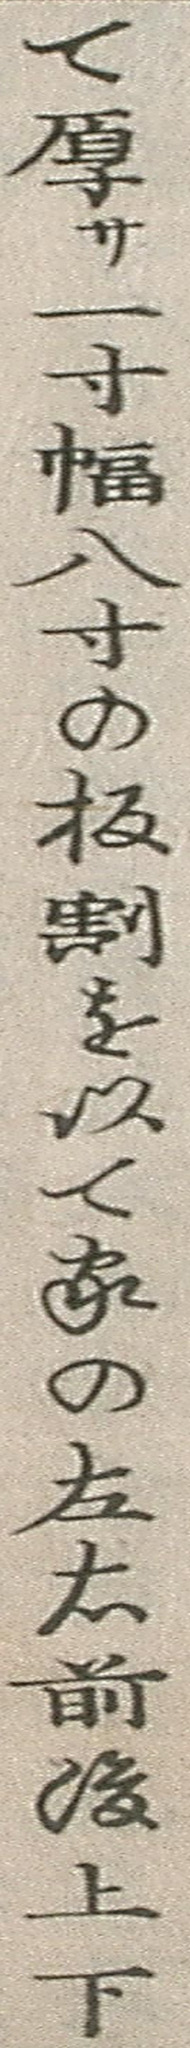て厚サ一寸幅八寸の板割を以て家の左右前後上下
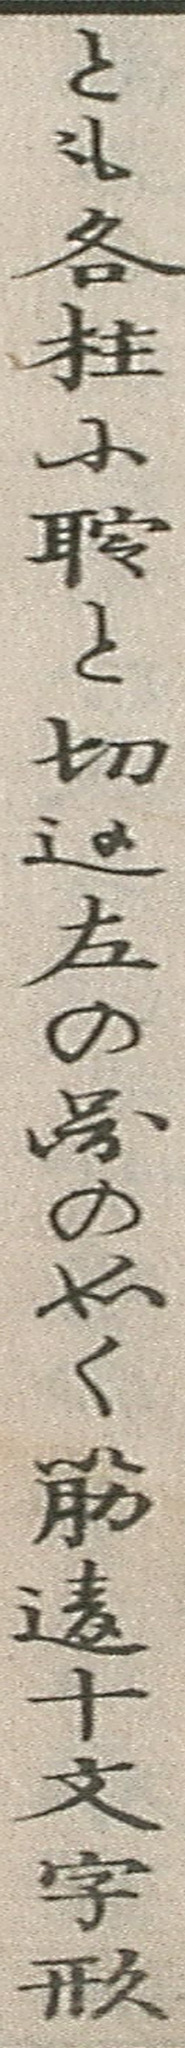とも各柱に聢と切込左の図の如く筋違十文字形
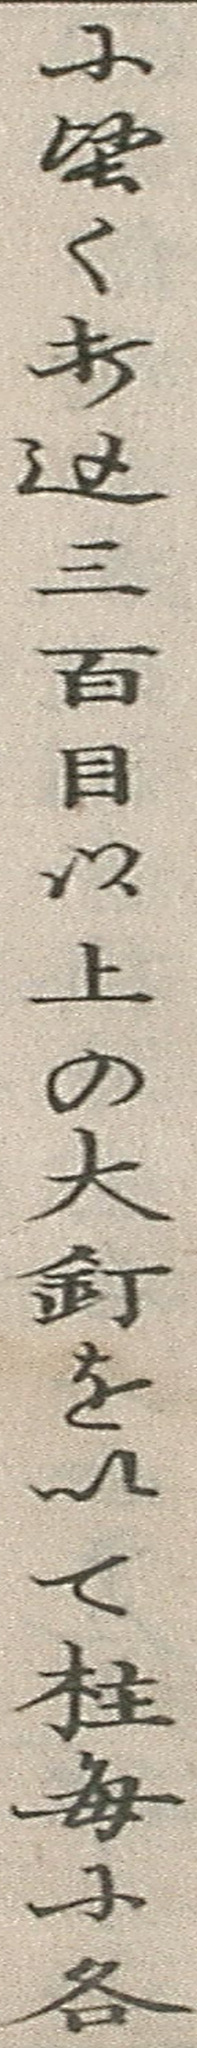に固く打込三百目以上の大釘を以て柱毎に各
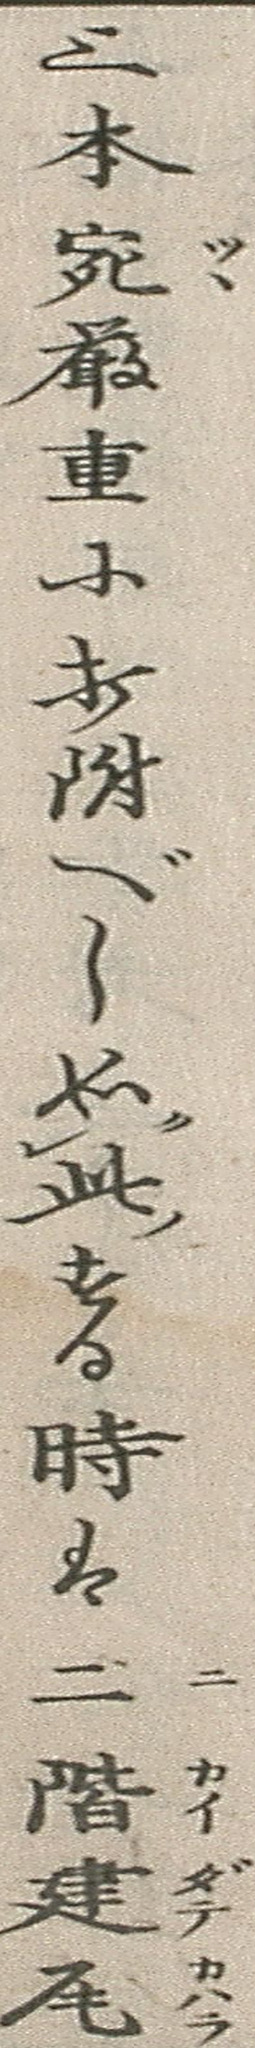三本宛厳重に打附べし如此時は二階建瓦
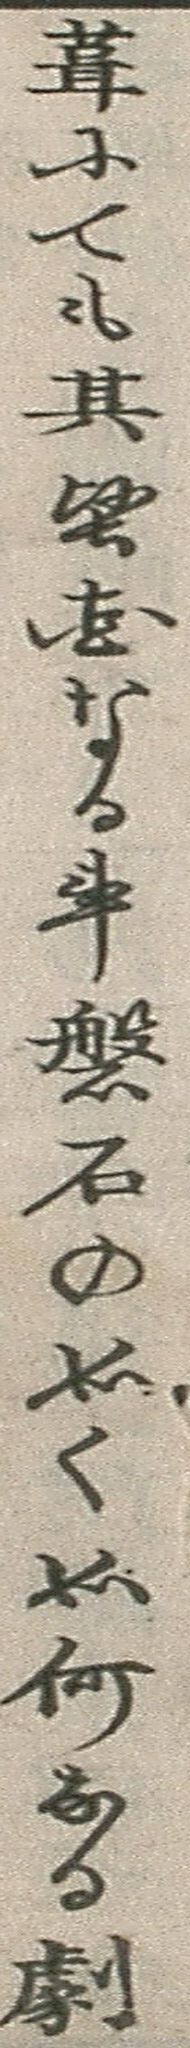葺にても其堅固なる事磐石の如く如何なる劇
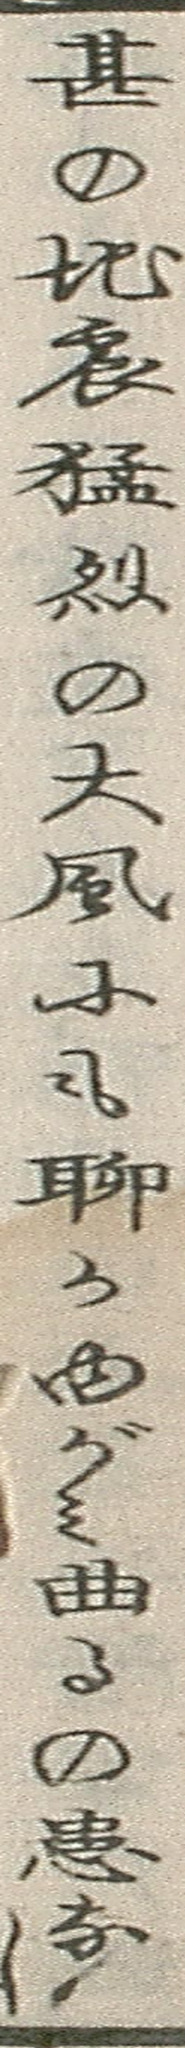甚の地震猛烈の大風にも聊かゆがみ曲るの患なし

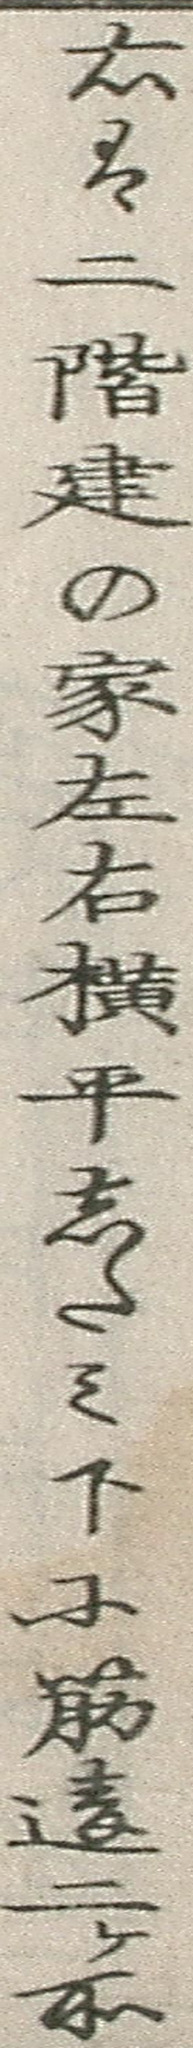右は二階建の家左右横平したみ下に筋違二ヶ所
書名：附録　地震劇風災害豫防法圖説（内題）
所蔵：東京大学地震研究所図書室 Earthquake Research Institute Library, The University of Tokyo, JAPAN
